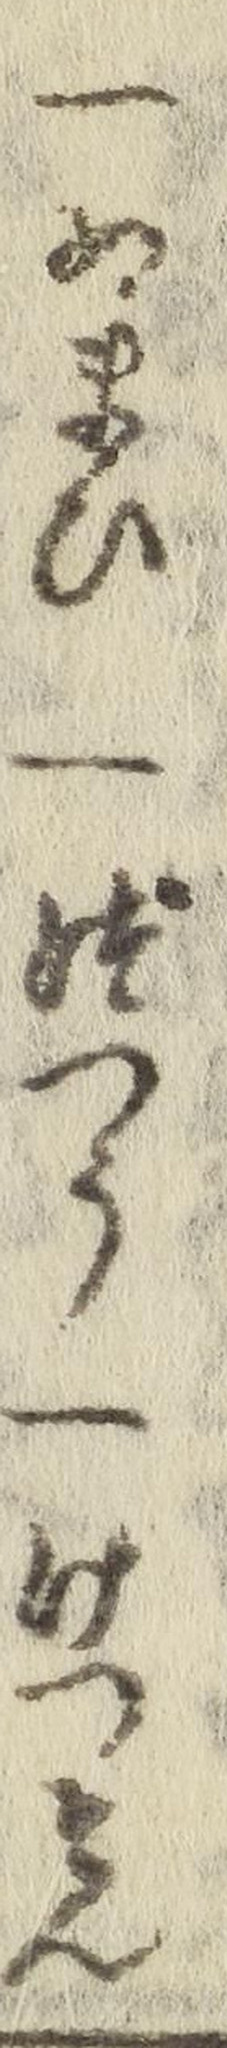一めまひ一づつう一けつそん
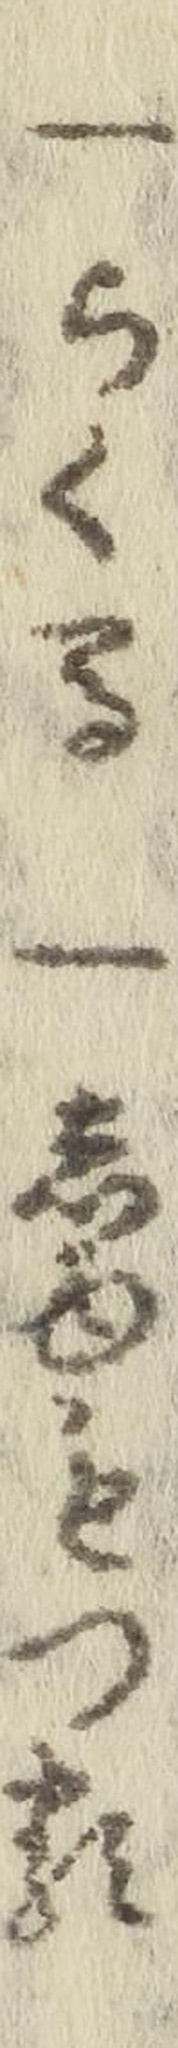一らく馬一しゆもつ類
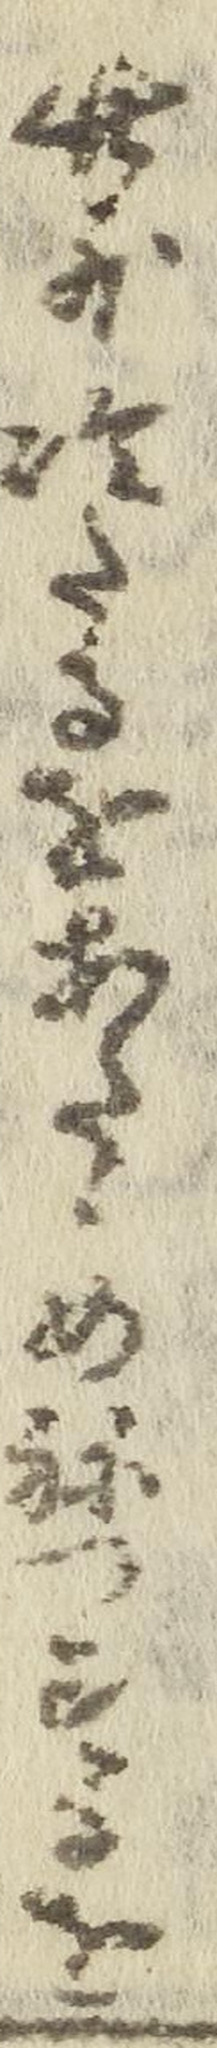此外冷たるをあたゝめねつするを
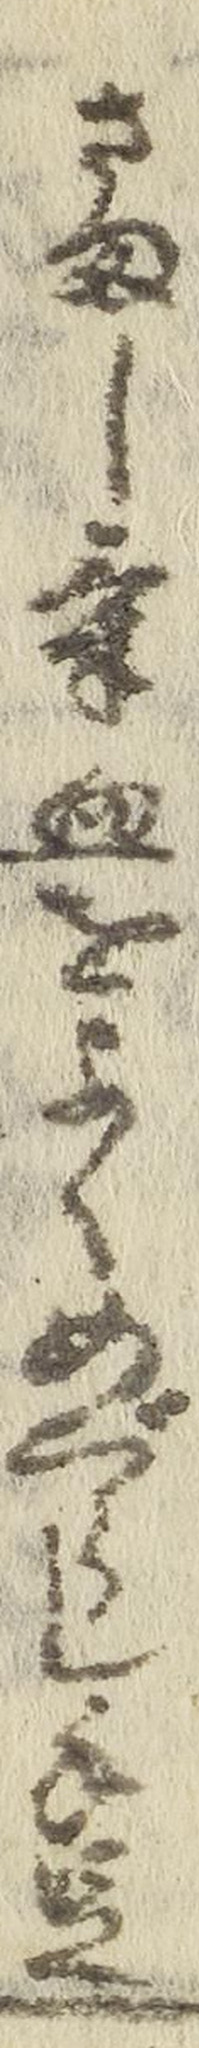さまし気血をよくめぐらし手足
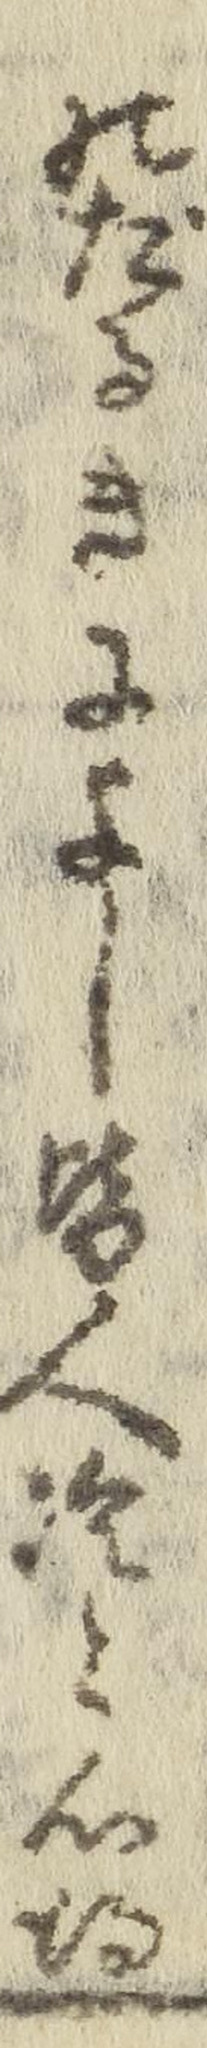のだるきによし皆人冷と心得
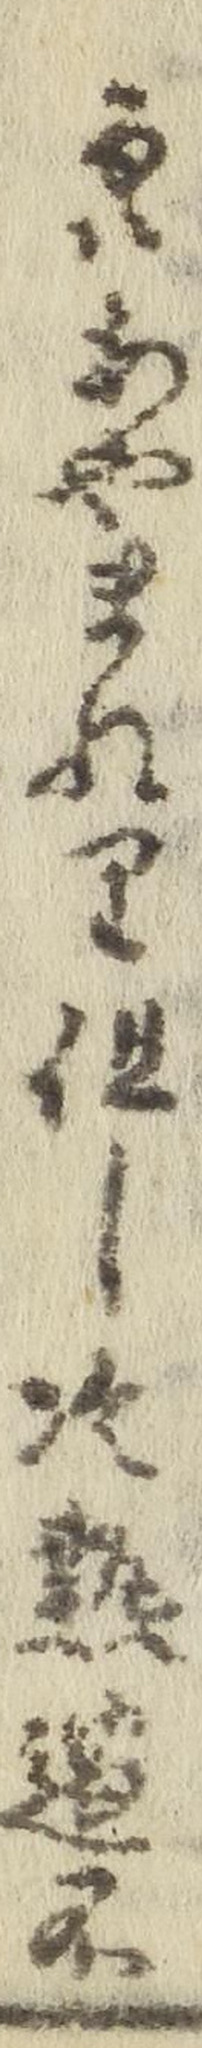るはあやまれり但し冷熱過不
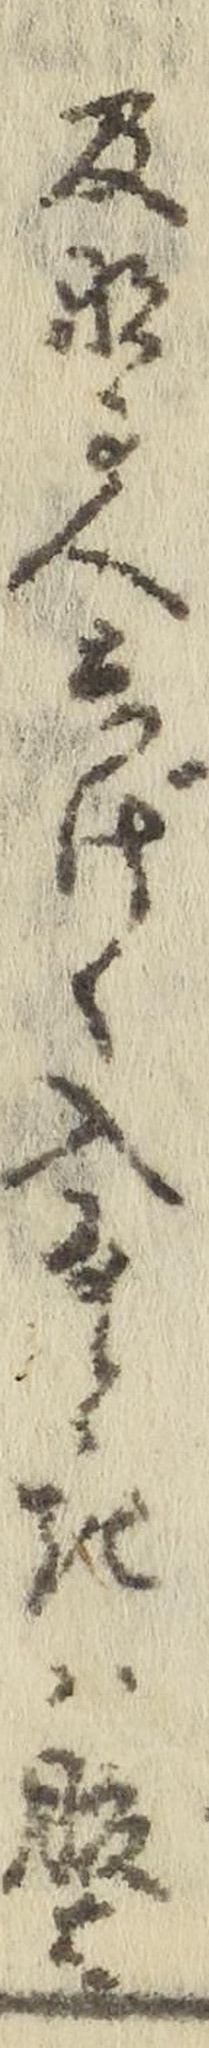及なる人しげく入るときは腹は
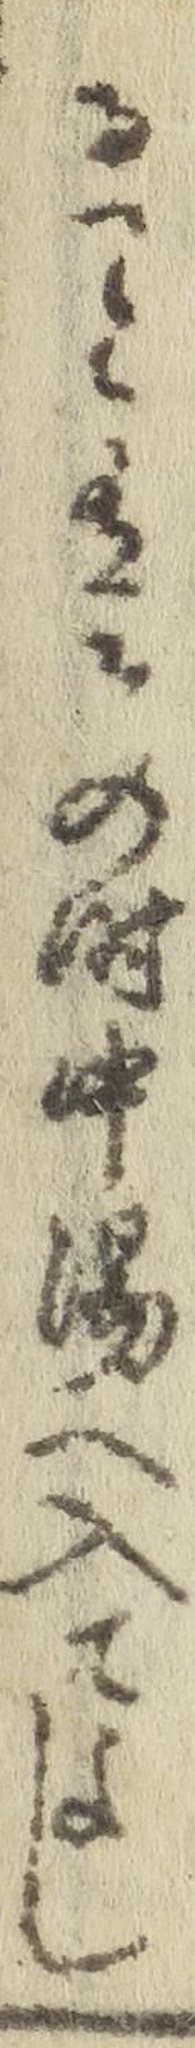ること有その時中湯へ入てよし

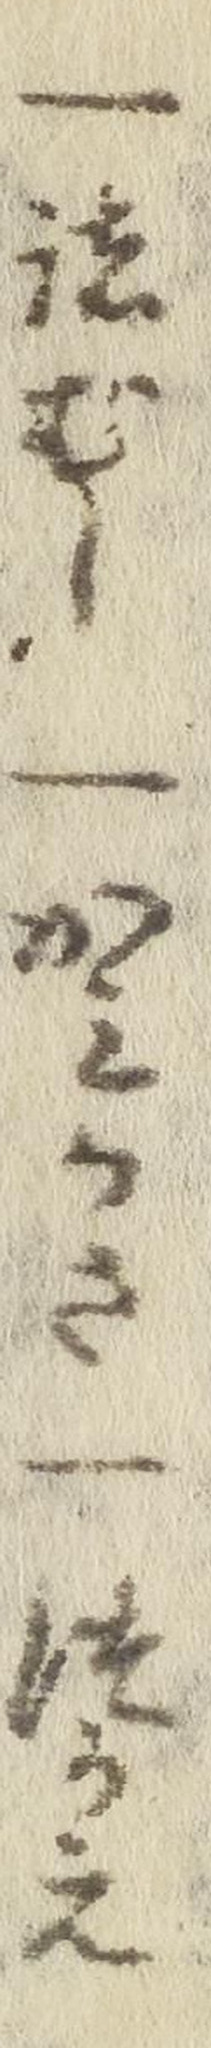一諸むし一かみかさ一つかえ
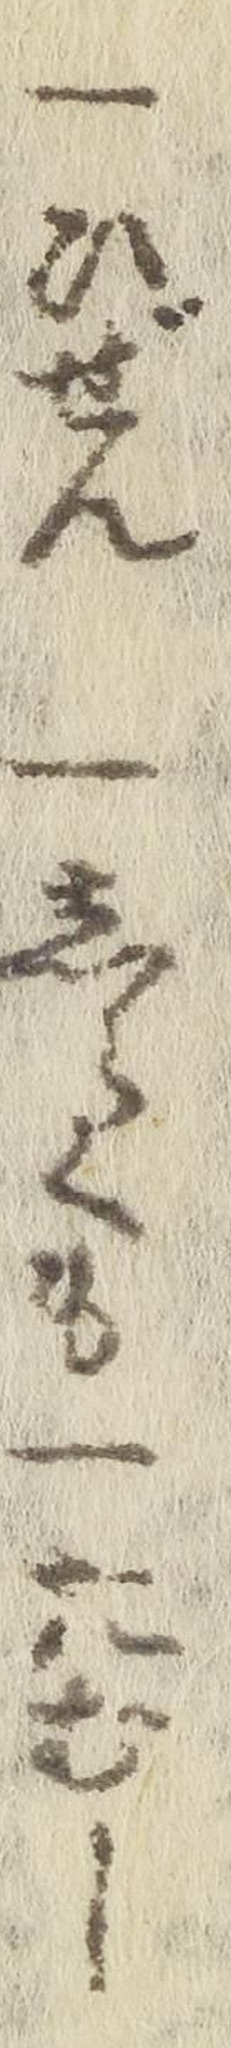一ひぜん一しらくも一たむし
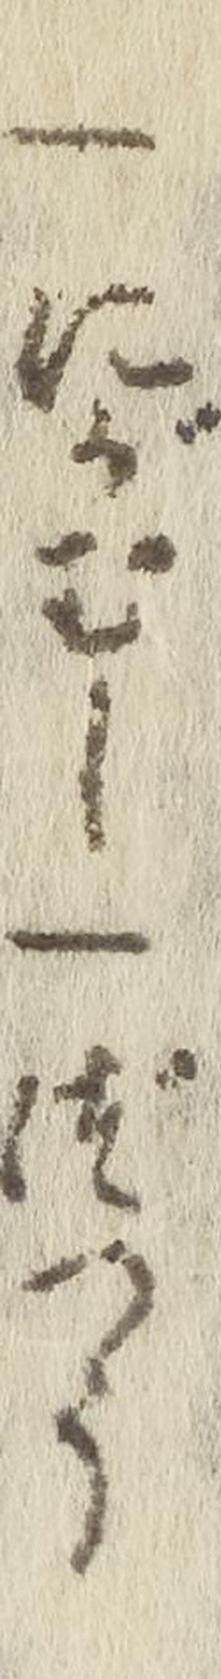一にがむし一づつう
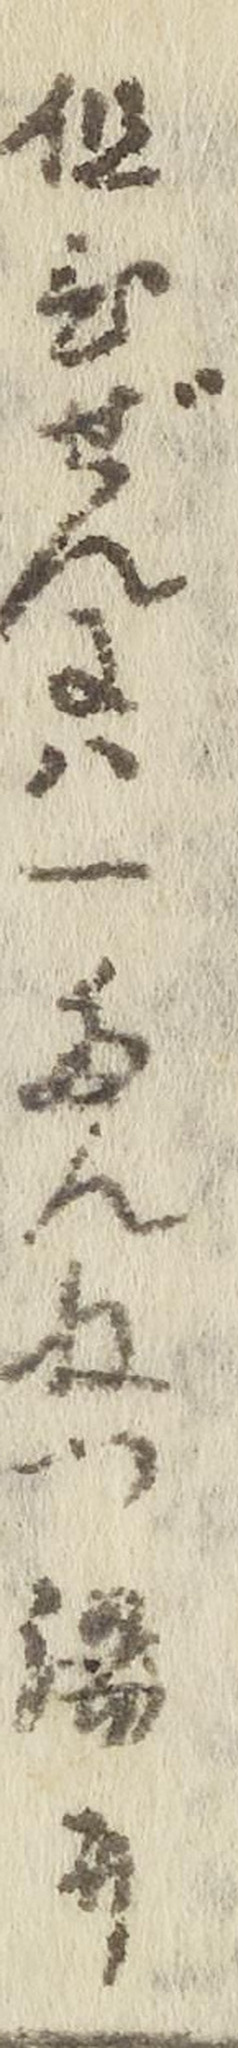但ひぜんには一たんねつ湯に
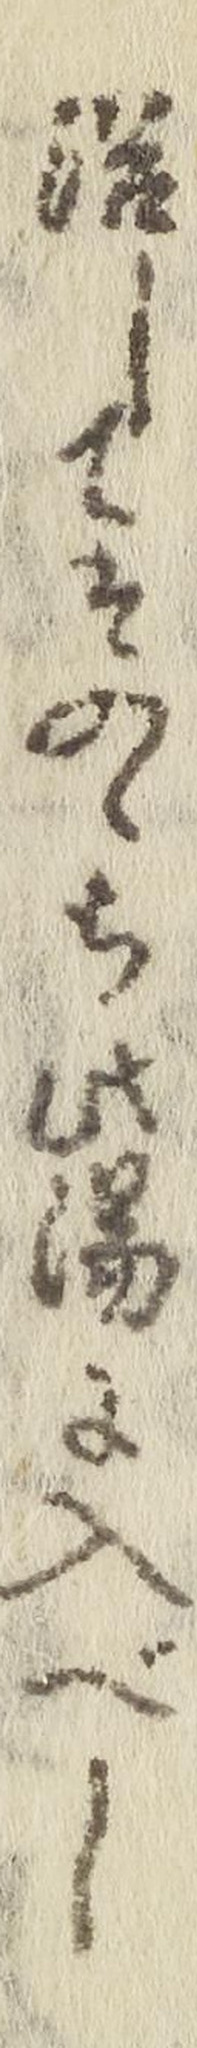浴してそのゝち此湯に入べし
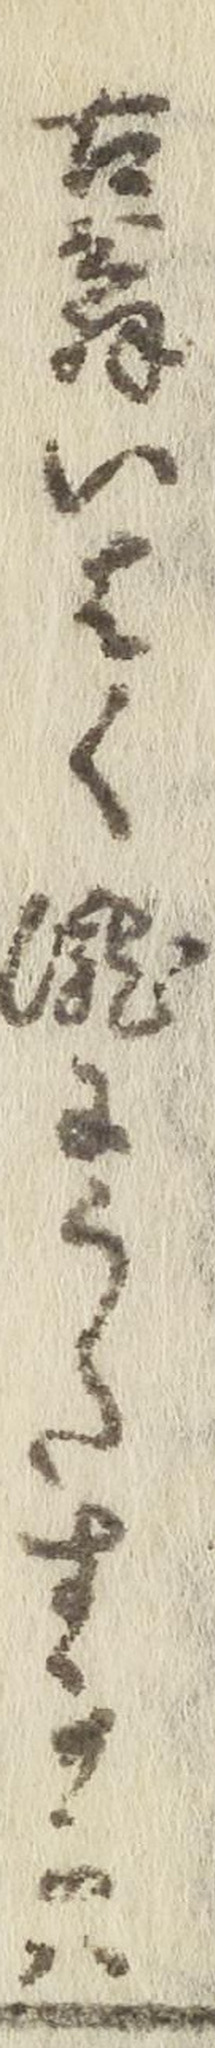古翁いはく滝にうたするには
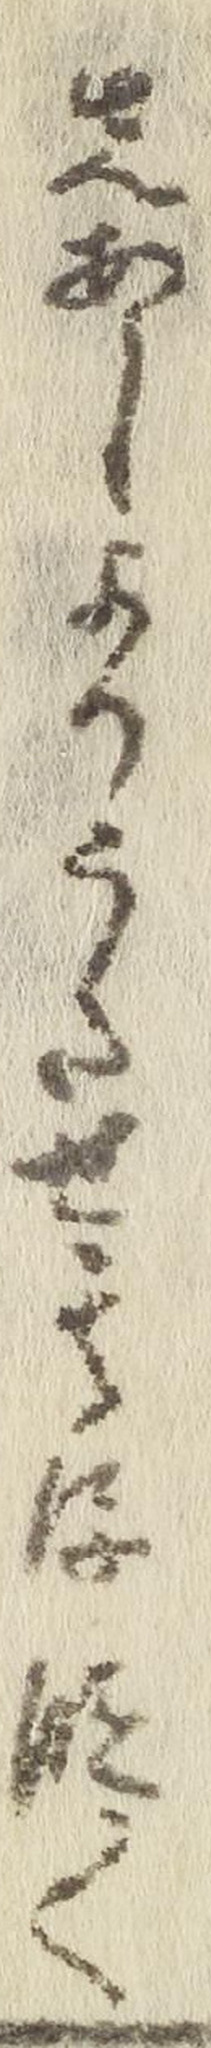先あしよりうたせ其後段〳〵
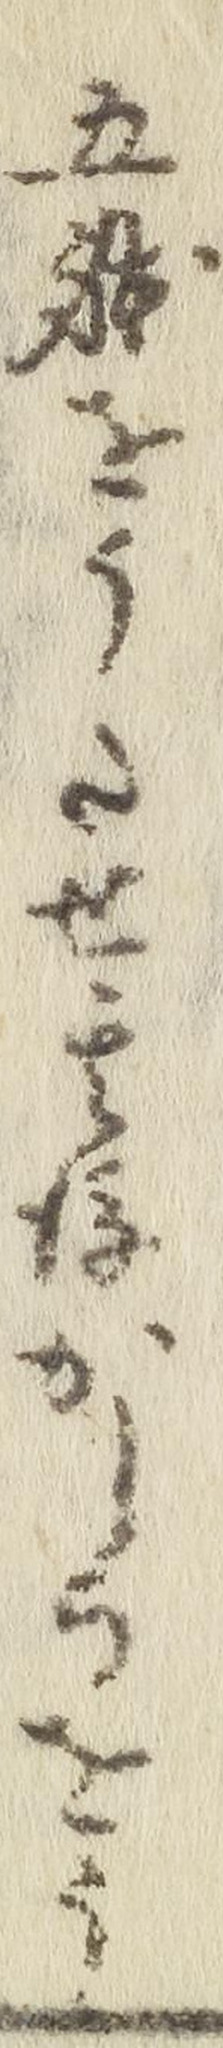五体をうたせ其後かしらをう
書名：日光山中禅寺　温泉記　全
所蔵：東京大学地震研究所図書室 Earthquake Research Institute Library, The University of Tokyo, JAPAN
